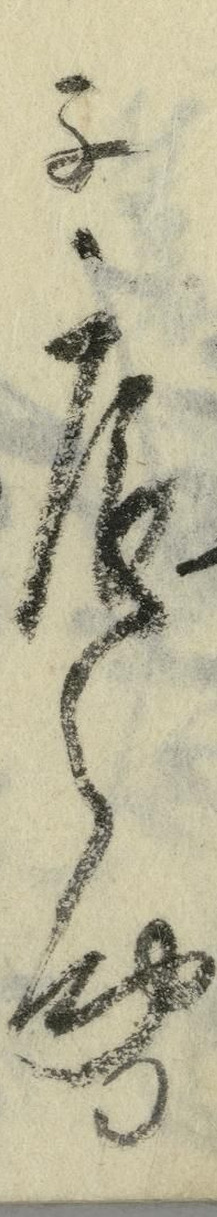子万之助
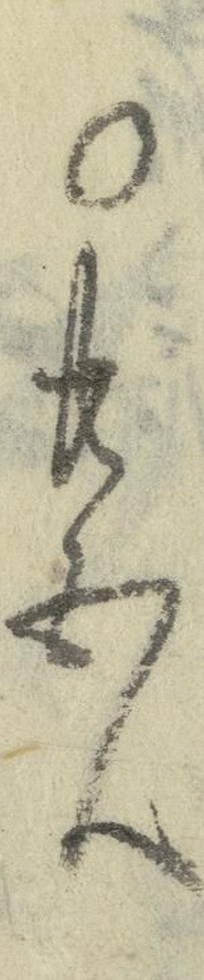○廿五人
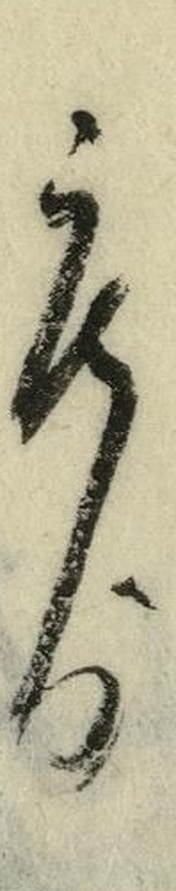庄右衛門
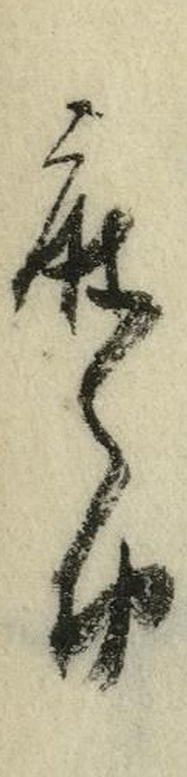庄兵衛

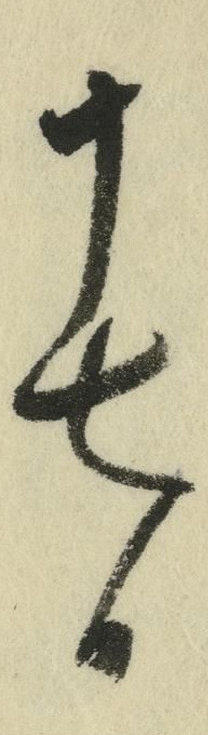十七日
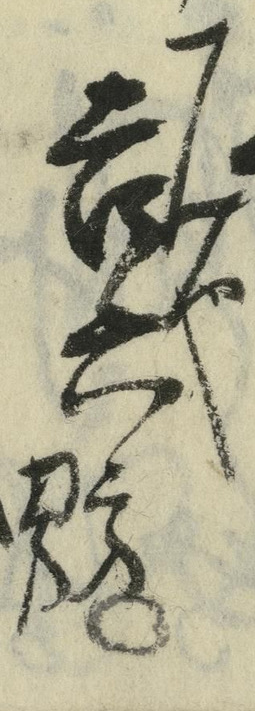吉六〇

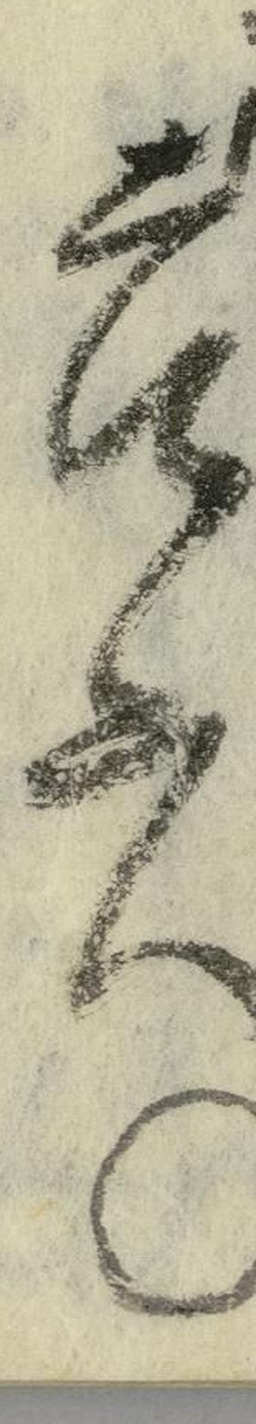磯右衛門
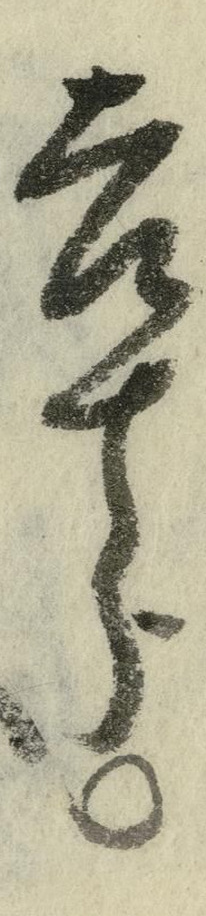甚十郎
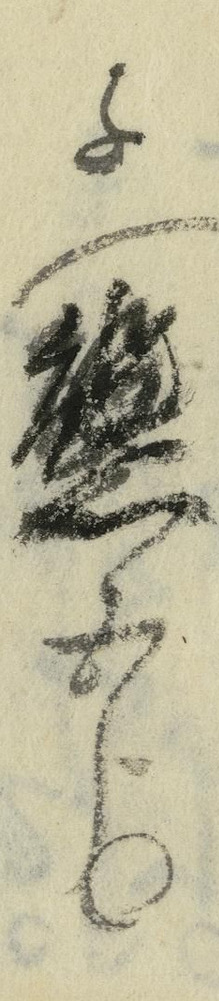子磯五郎
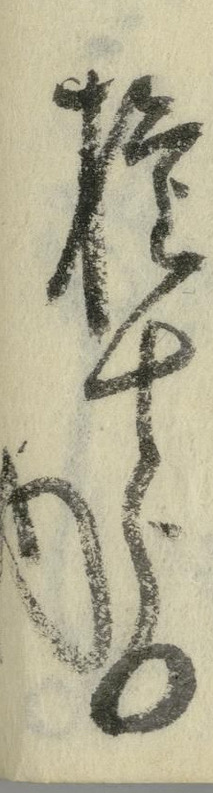甚十郎
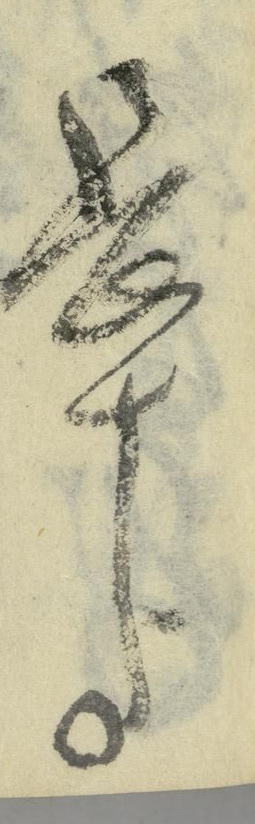甚十郎
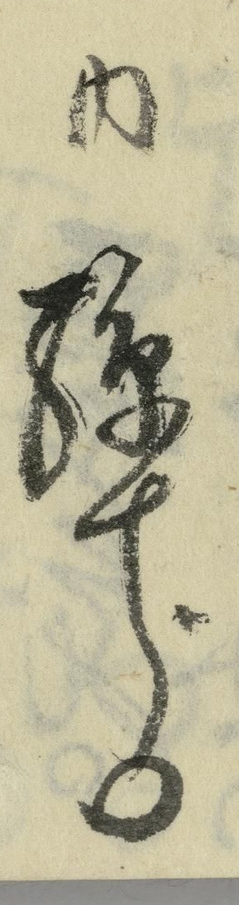内孫十郎
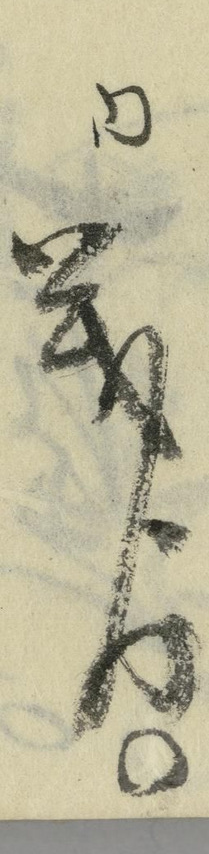内義右衛門
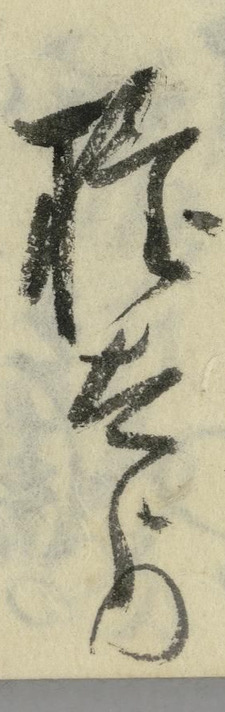権太郎
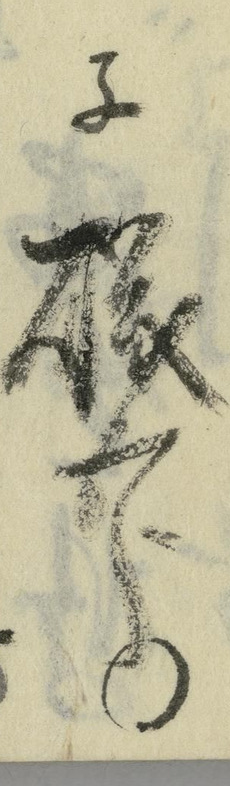子磯五郎
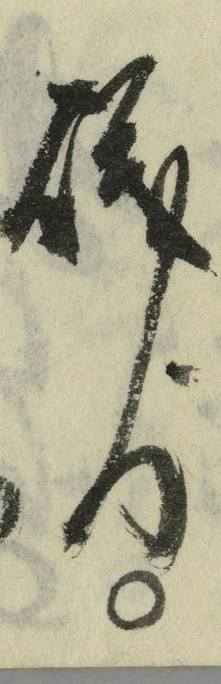磯右衛門
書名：天明淺間噴火ニ関スル書類
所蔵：東京大学地震研究所図書室 Earthquake Research Institute Library, The University of Tokyo, JAPAN
